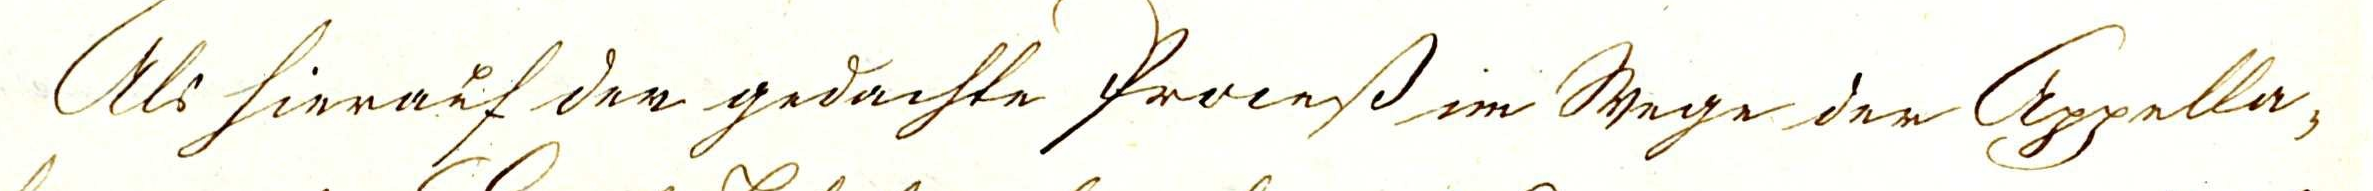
Als hierauf der gedachte Proceß im Wege der Appella¬
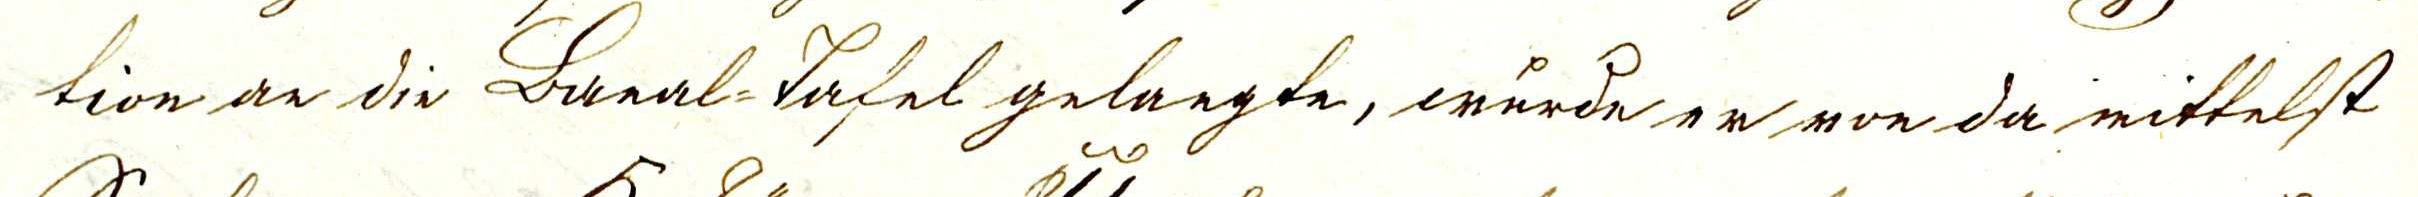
tion an die Banal-Tafel gelangte, wurde er von da mittelst
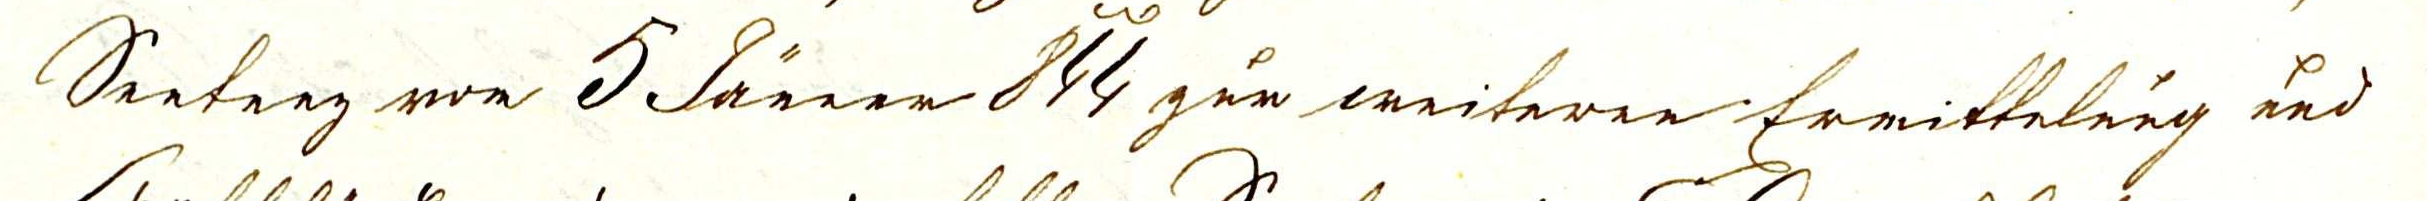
Sentenz vom 5 Jänner 844 zur weiteren Ermittelung und
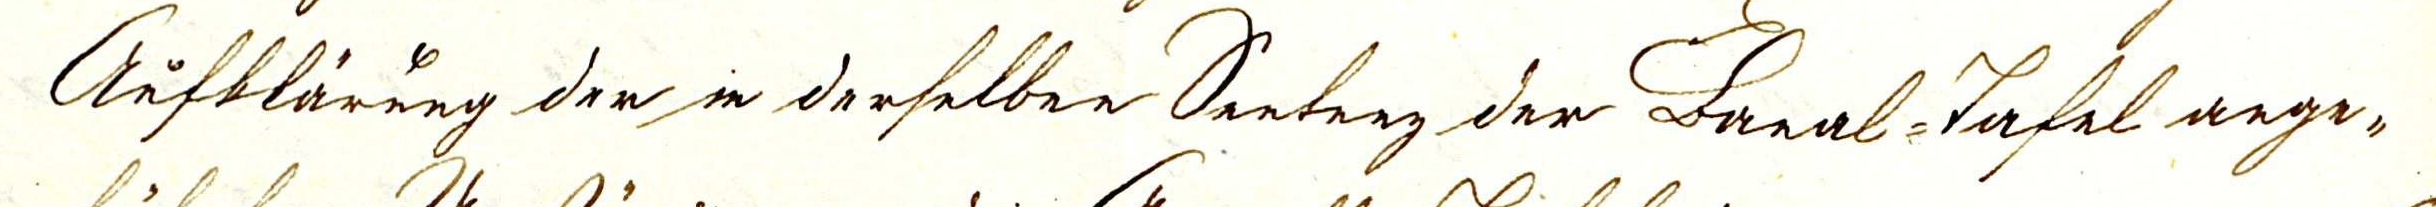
Aufklärung der in derselben Sentenz der Banal-Tafel ange¬
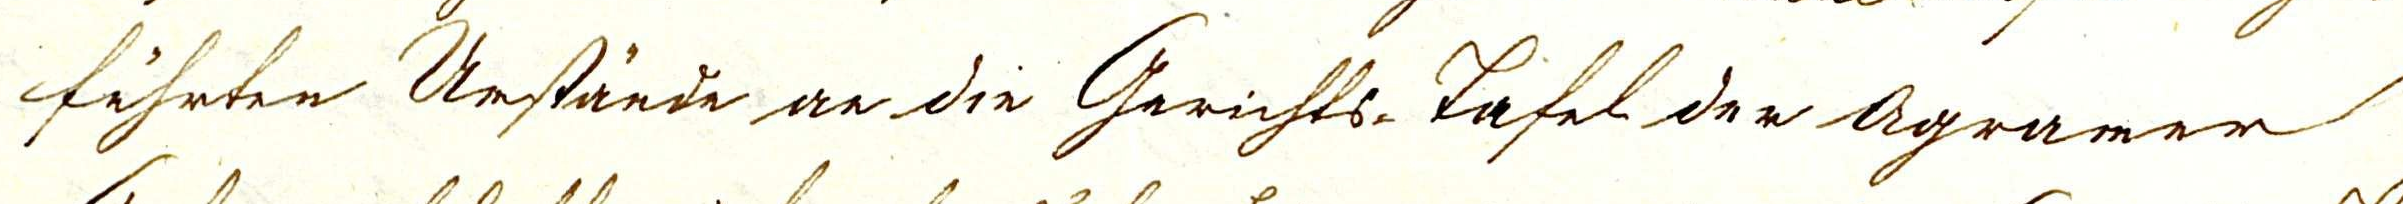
führten Umstände an die Gerichts-Tafel der Agramer
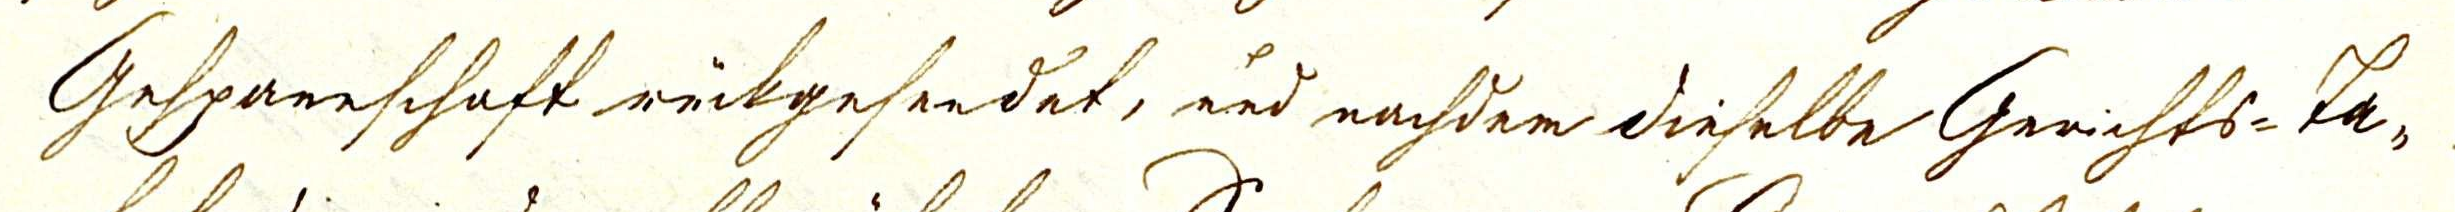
Gespannschaft rückgesendet, und nachdem dieselbe Gerichts-Ta¬
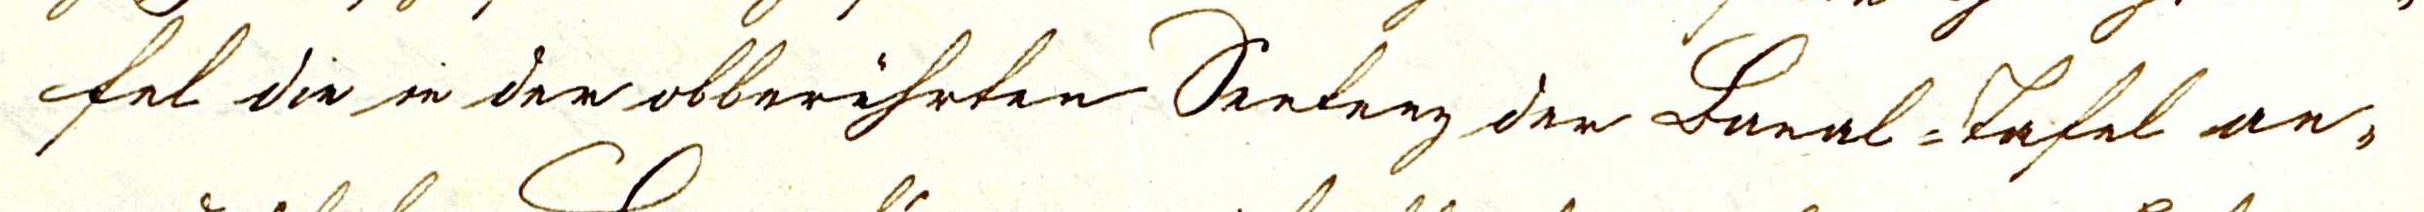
fel die in der obberührten Sentenz der Banal-Tafel an¬
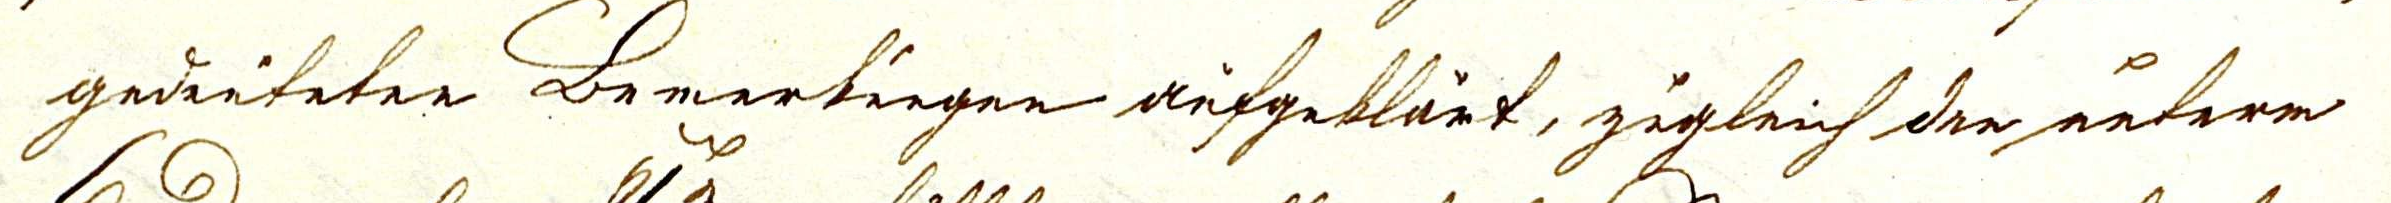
gedeuteten Bemerkungen aufgeklärt, zugleich den unterm
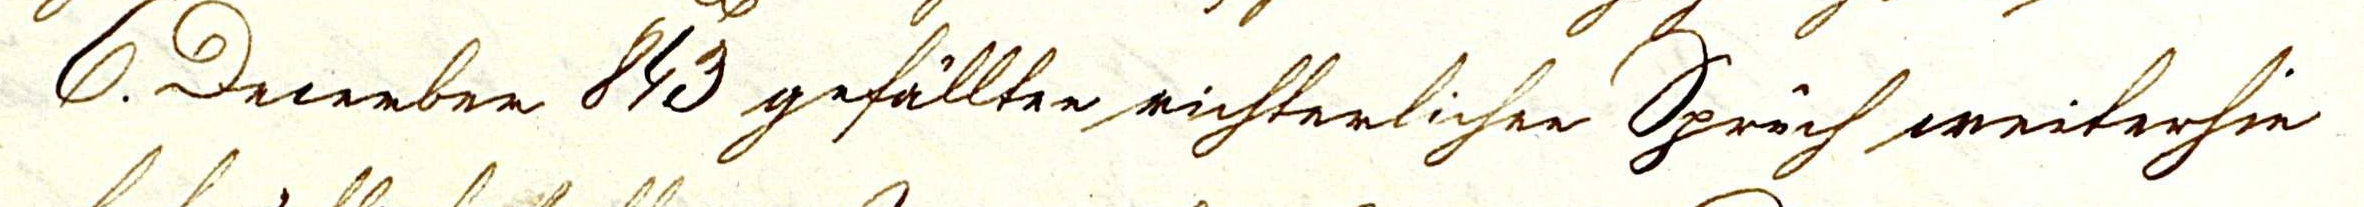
6. December 843 gefällten richterlichen Spruch weiterhin
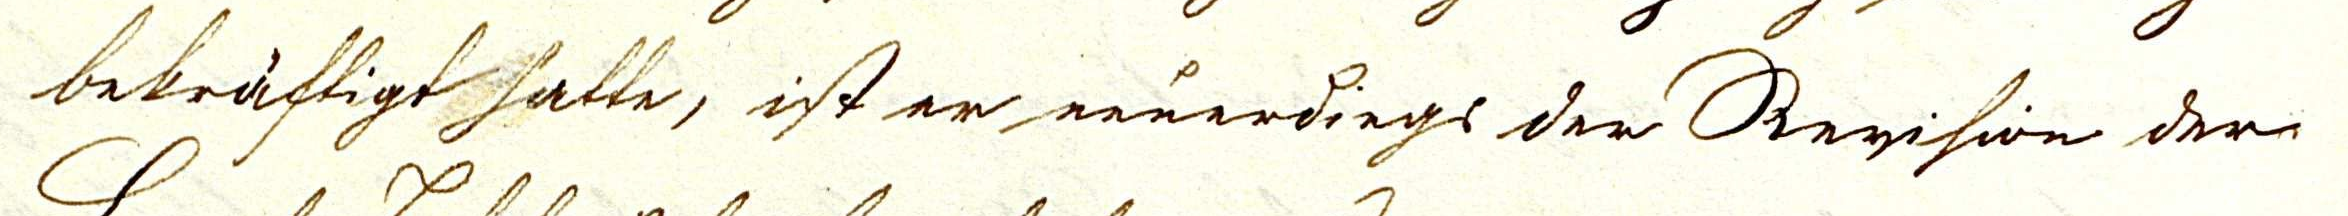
bekräftigt hatte, ist er neuerdings der Revision der
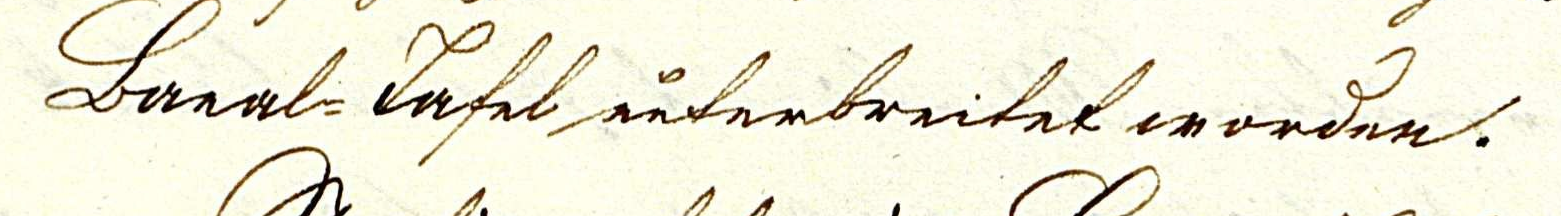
Banal-Tafel unterbreitet worden.
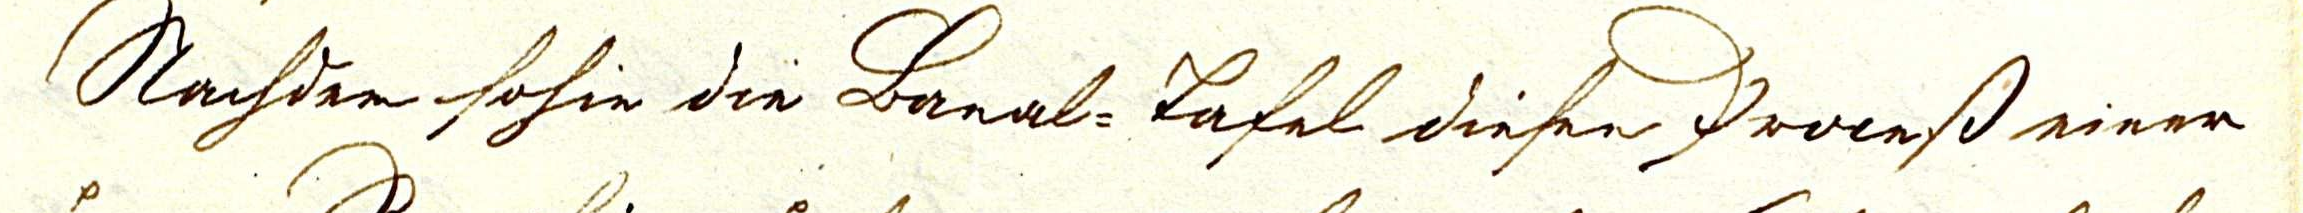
Nachdem sohin die Banal-Tafel diesen Proceß einer
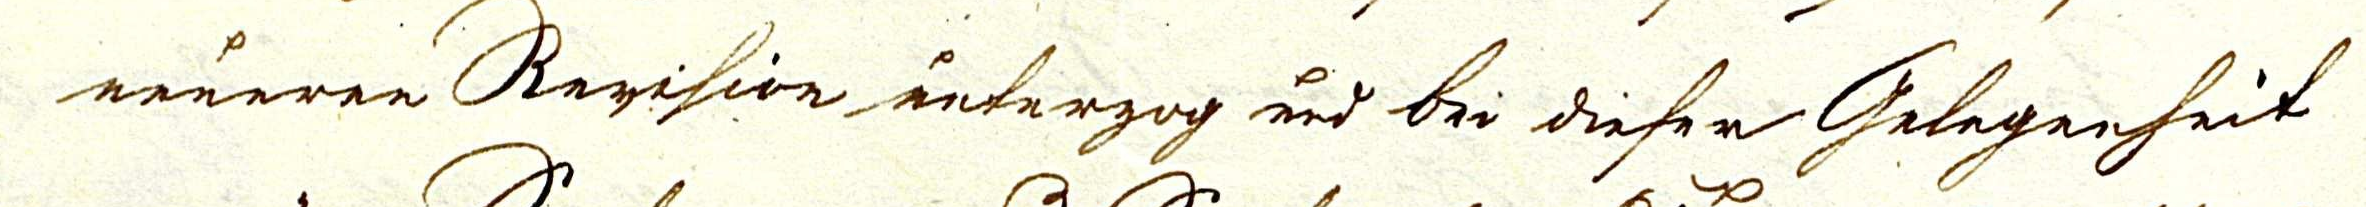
neueren Revision unterzog und bei dieser Gelegenheit
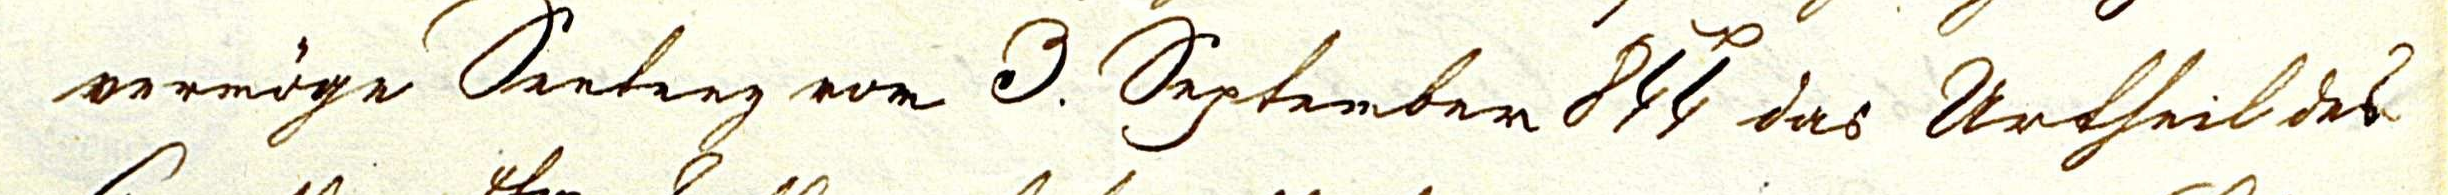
vermöge Sentenz vom 3. September 844 das Urtheil des
